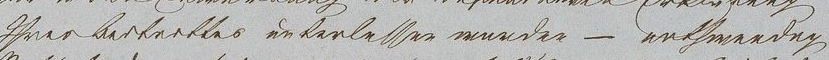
Ihres Beitrittes unterlassen worden – nothwendig
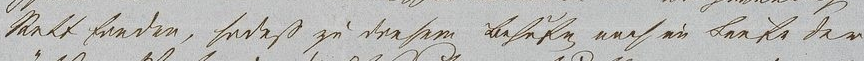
Statt finden, sodaß zu diesem Behufe noch im Laufe der
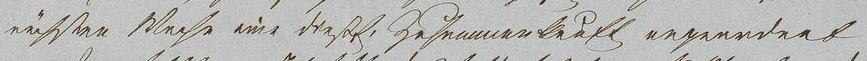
nächsten Woche eine dießb. Zusammenkunft angeordnet
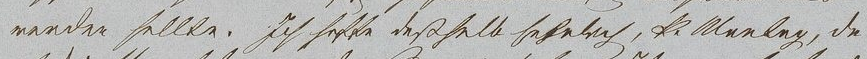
werden sollte. Ich hoffe deßhalb sehnlich, k. Montag, da
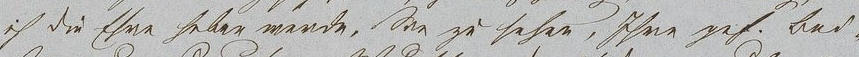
ich die Ehre haben werde, Sie zu sehen, Ihre gef. Bei-
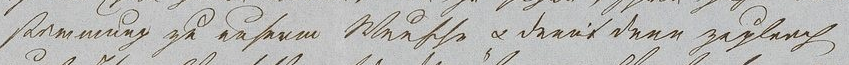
stimmung zu unserm Wunsche & damit dann zugleich
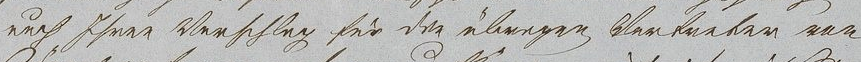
auch Ihren Vorschlag für die übrigen Vertreter von
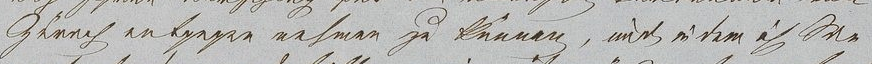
Zürich entgegen nehmen zu können, und indem ich Sie
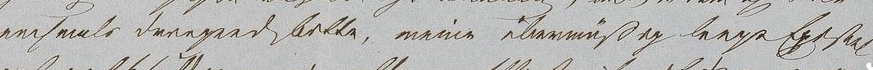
nochmals dringend bitte, meine übermäßig lange Epistel
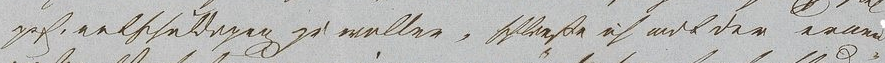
gef. entschuldigen zu wollen, schließe ich mit der erneu-
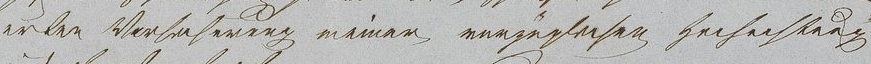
erten Versicherung meiner vorzüglichen Hochachtung
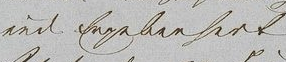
und Ergebenheit.
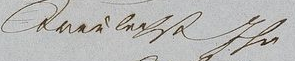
Treulichst Ihr
